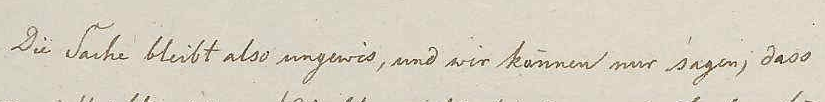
Die Sache bleibt also ungewis, und wir können nur sagen, dass
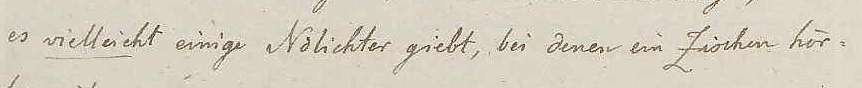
es vielleicht einige Ndlichter giebt, bei denen ein Zischen hör-
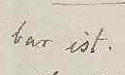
bar ist.
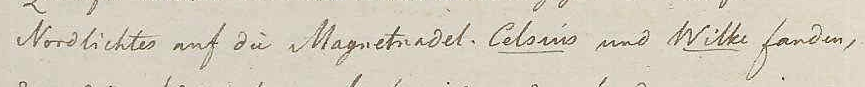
Nordlichtes auf die Magnetnadel. Celsius und Wilke fanden,
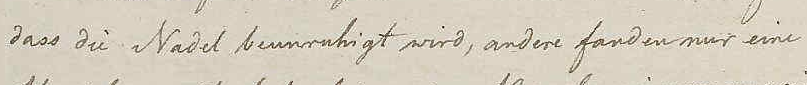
dass die Nadel beunruhigt wird, andere fanden nur eine
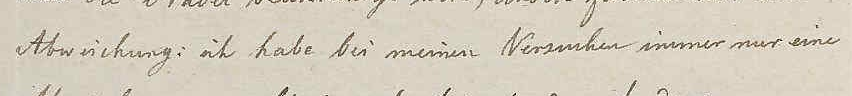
Abweichung: ich habe bei meinen Versuchen immer nur eine
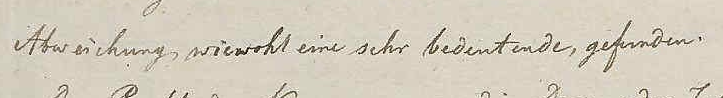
Abweichung, wiewohl eine sehr bedeutende, gefunden.
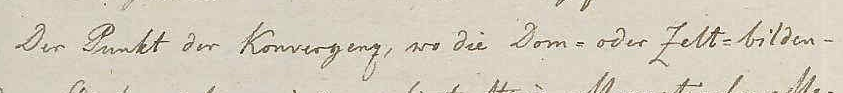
Der Punkt der Konvergenz, wo die Dom- oder Zelt-bilden-
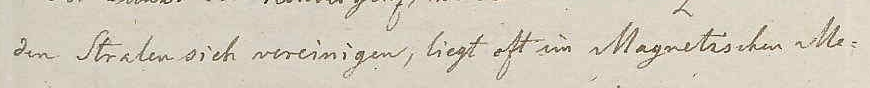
den Stralen sich vereinigen, liegt oft im Magnetischen Me-
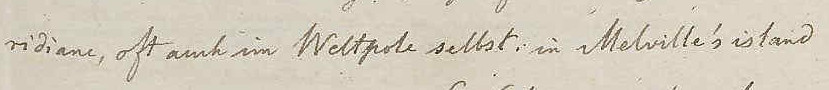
ridiane, oft auch im Weltpole selbst: in Melville's island
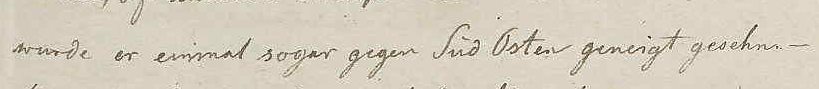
wurde er einmal sogar gegen Süd Osten geneigt gesehn. –
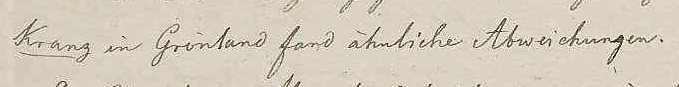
Kranz in Grönland fand ähnliche Abweichungen.
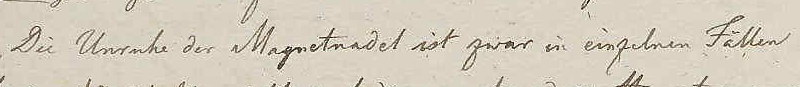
Die Unruhe der Magnetnadel ist zwar in einzelnen Fällen
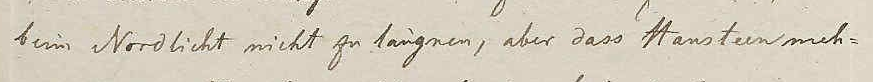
beim Nordlicht nicht zu läugnen, aber dass Hansteen meh-
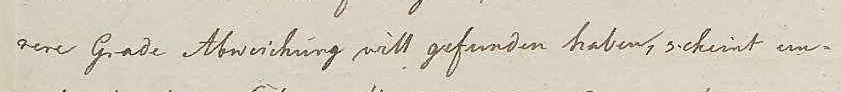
rere Grade Abweichung will gefunden haben, scheint un-
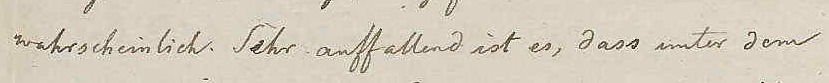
wahrscheinlich. Sehr auffallend ist es, dass unter dem
